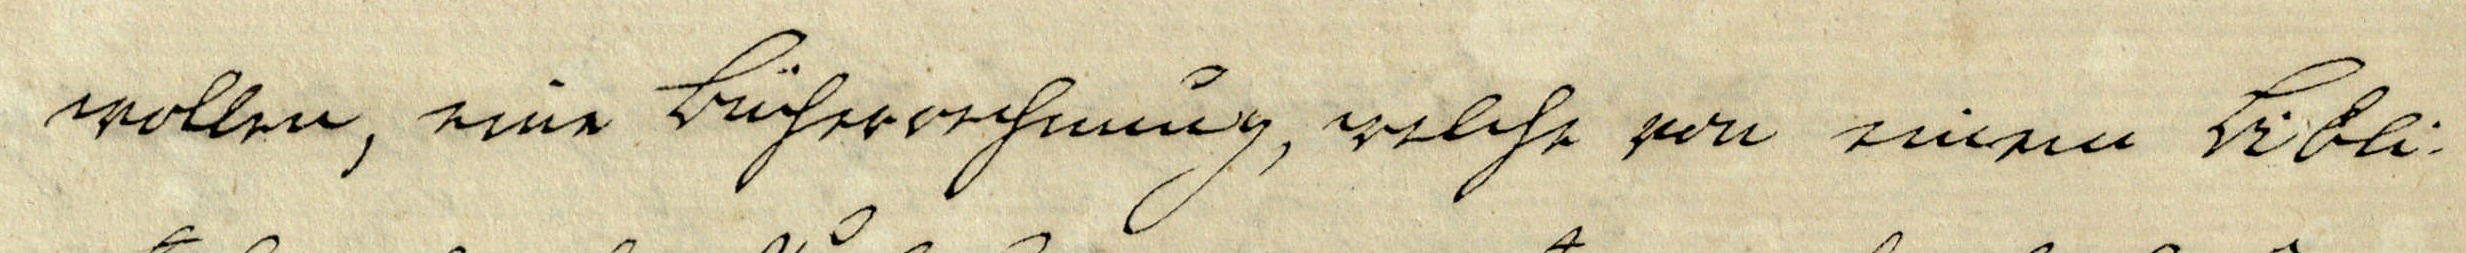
wollen, eine Bücherrechnung, welche von einem Bibli¬
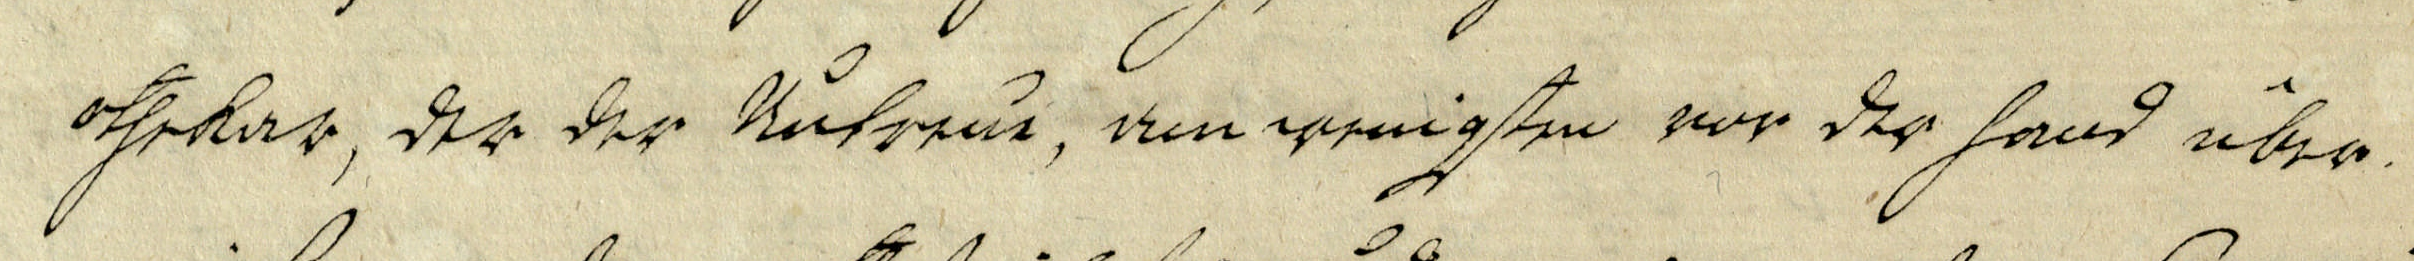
othekar, der der Untreue, am wenigsten vor der Hand über¬
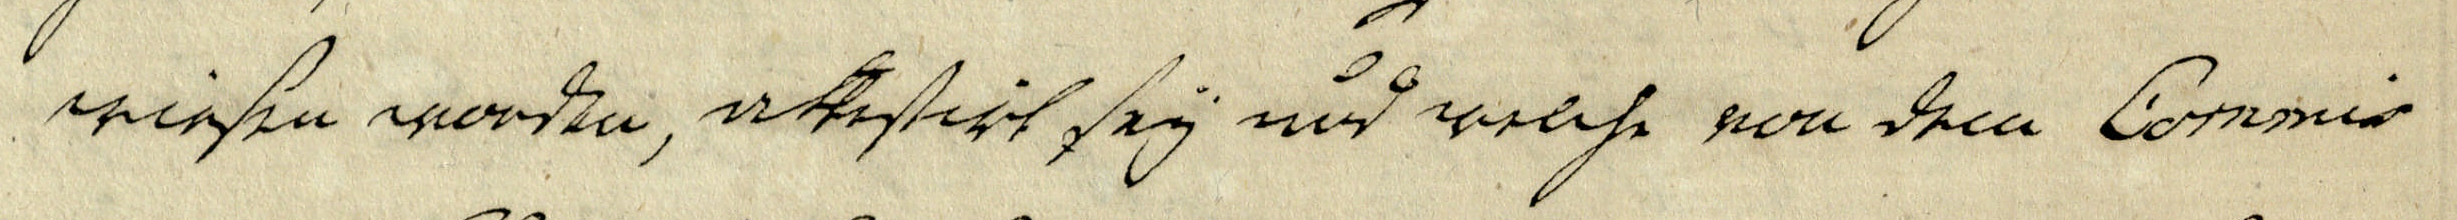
wiesen worden, attestirt seÿ und welche von dem Commis
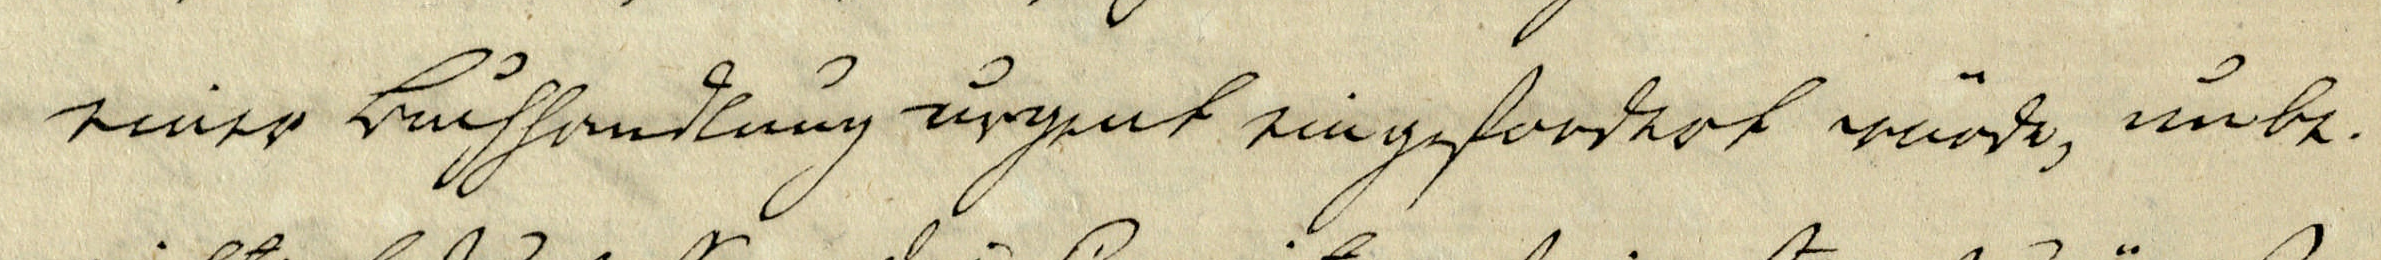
einer Buchandlung urgent eingefordert würde, unbe¬
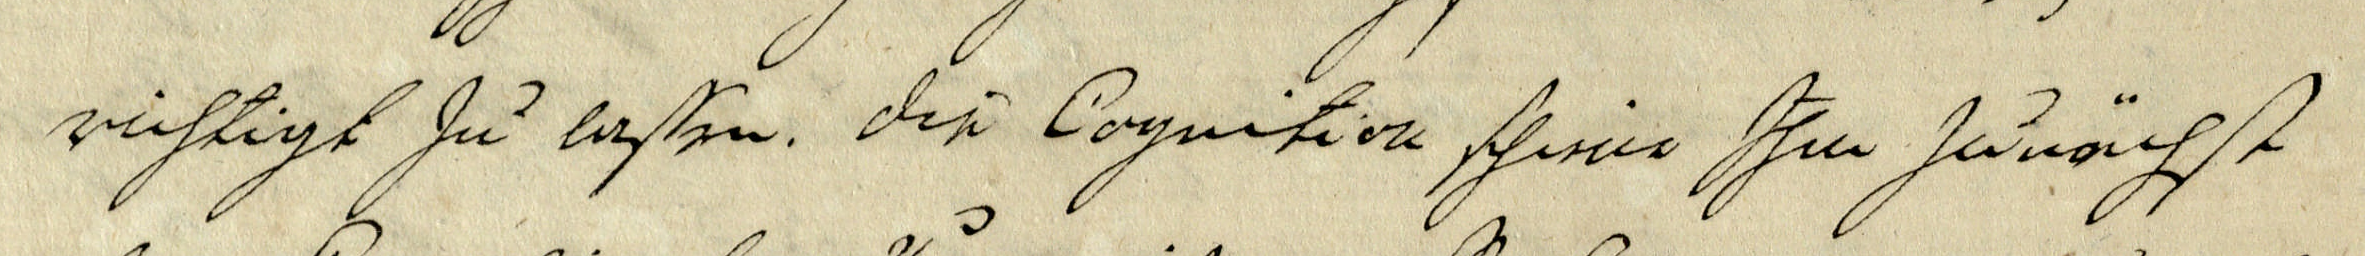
richtigt zu lassen. die Cognition schiene Ihm zunächst
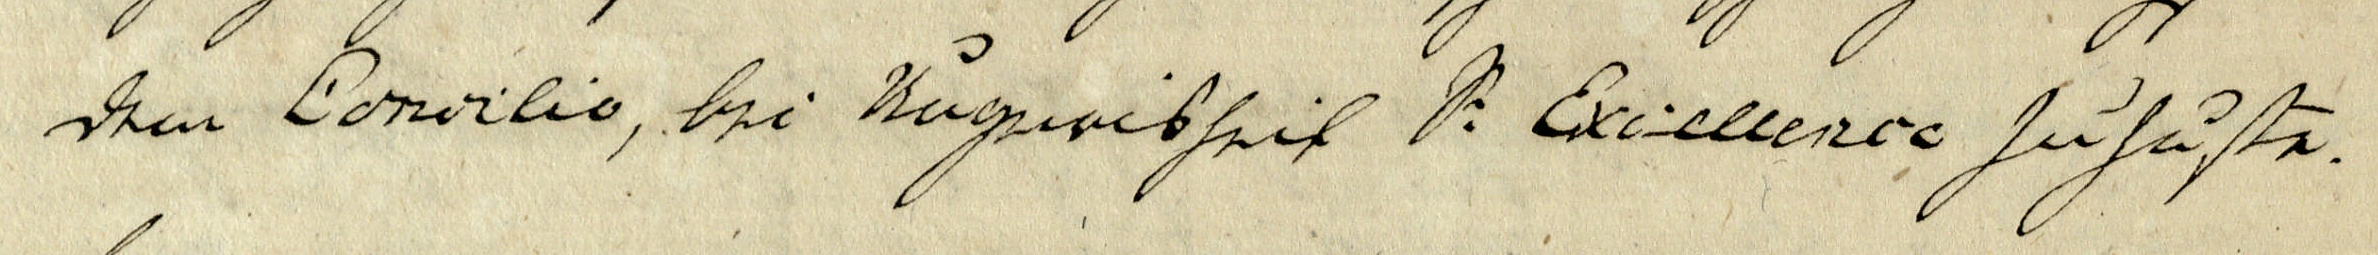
dem Concilio, bei Ungewisheit Sr. Excellence zuzuste¬
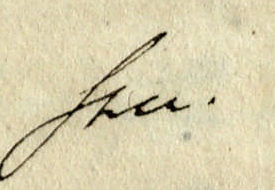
en.
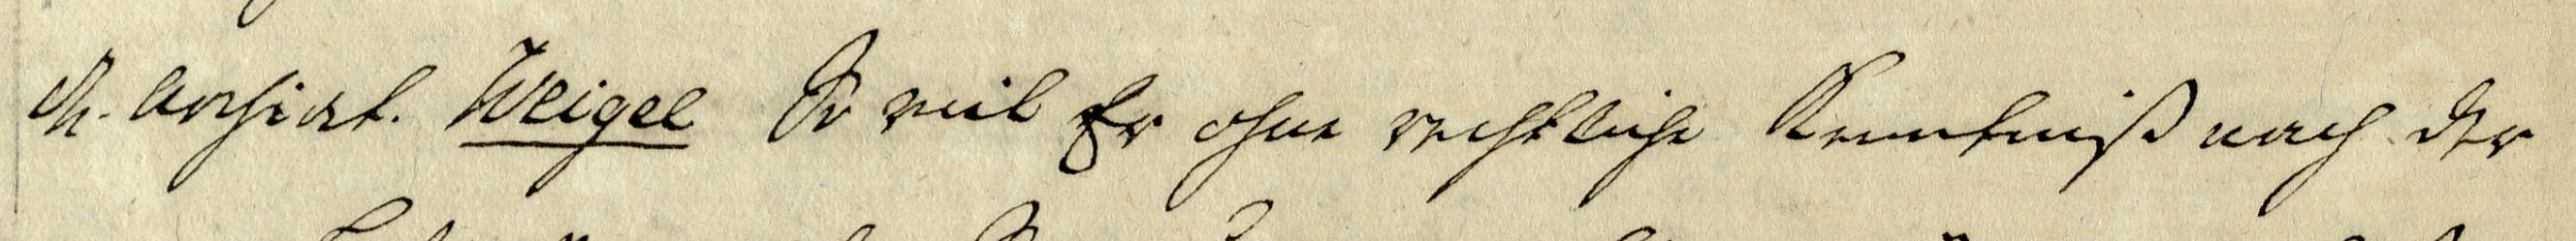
dh. Archiat. Weigel So viel Er ohne rechtliche Kenntniß nach der
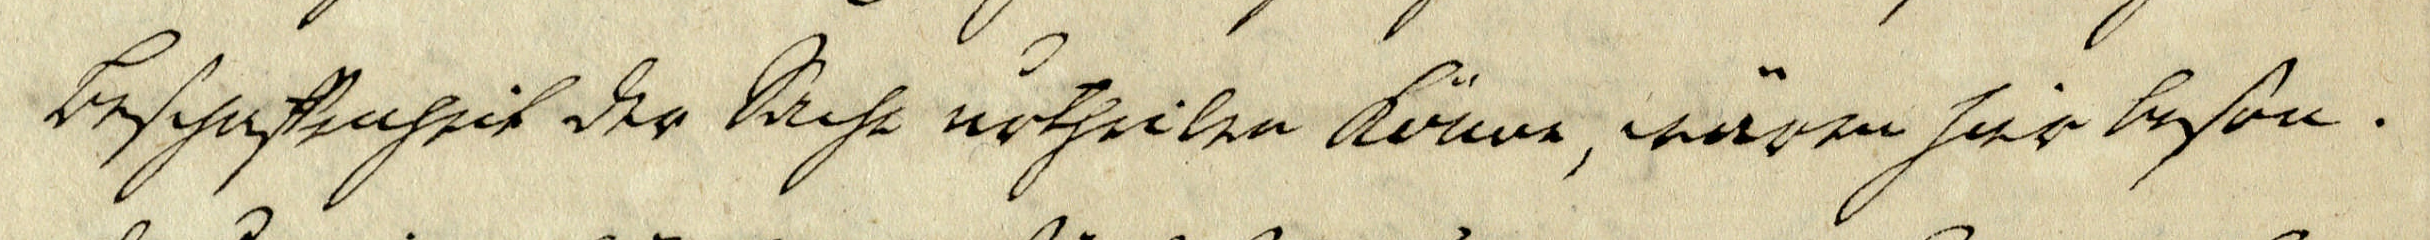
Beschaffenheit der Sache urtheilen könne, wären hier beson¬
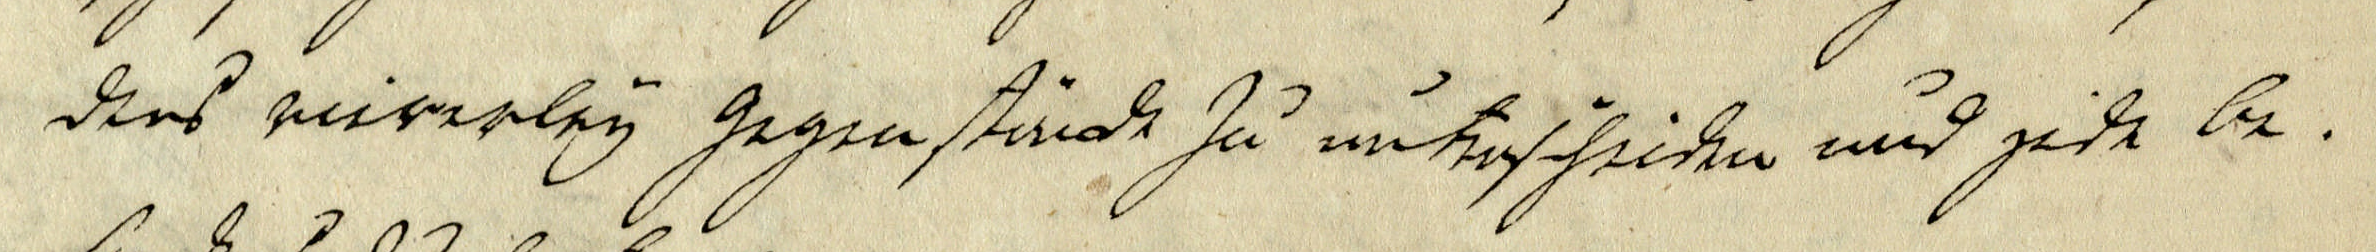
ders viererleÿ Gegenstände zu unterscheiden und jede be¬
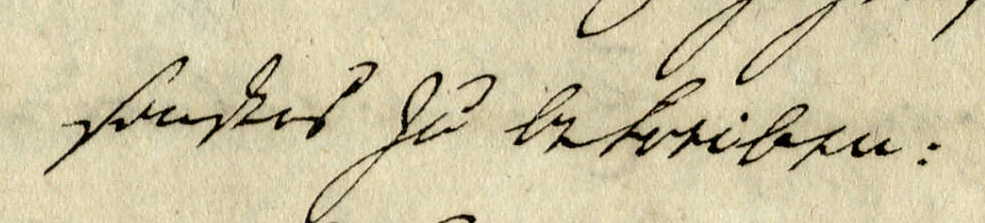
sonders zu betreiben:
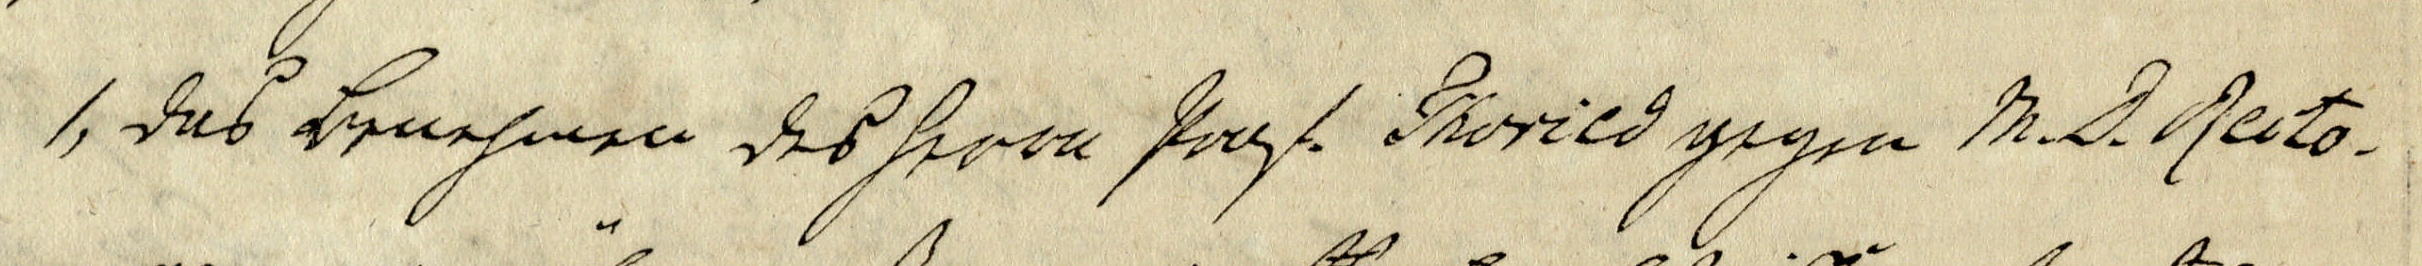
1, das Benehmen des Herrn Prof. Thorild gegen M. D. Recto¬
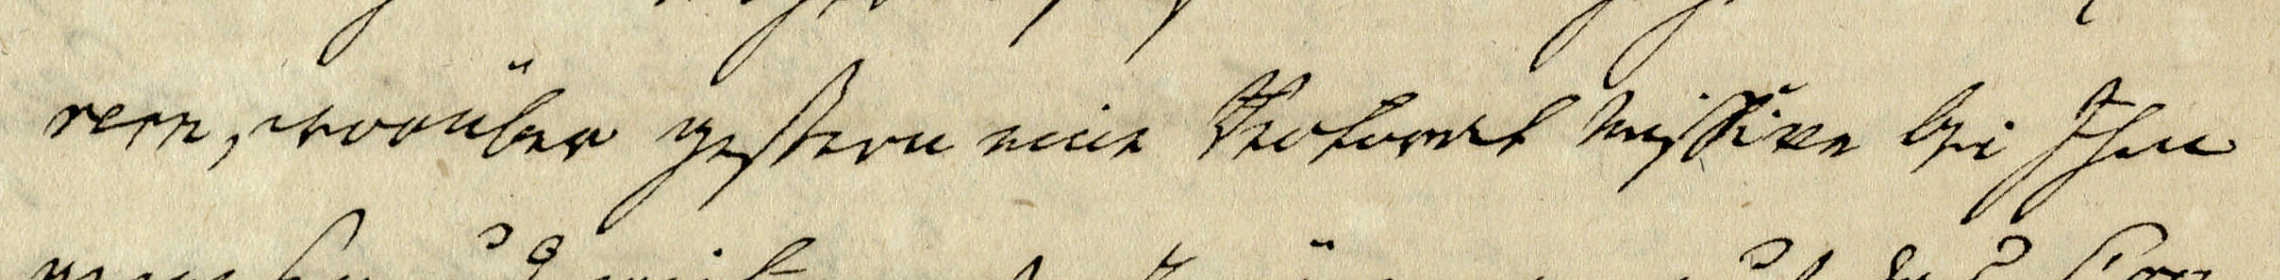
rem, worüber gestern eine Rectorat Missive bei Ihm
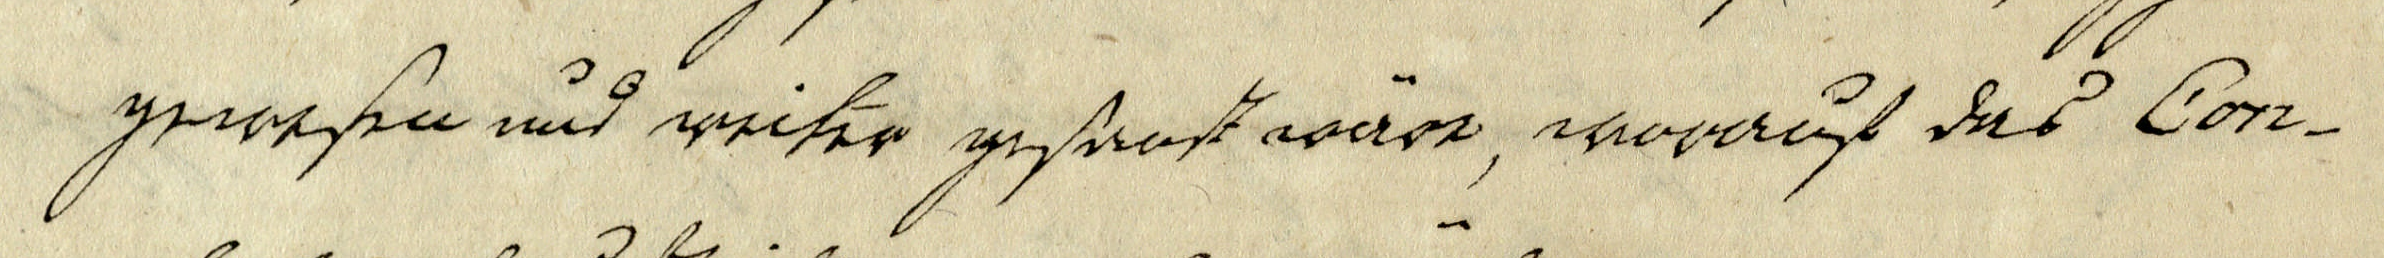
gewesen und weiter gesandt wäre, worauf das Con¬
